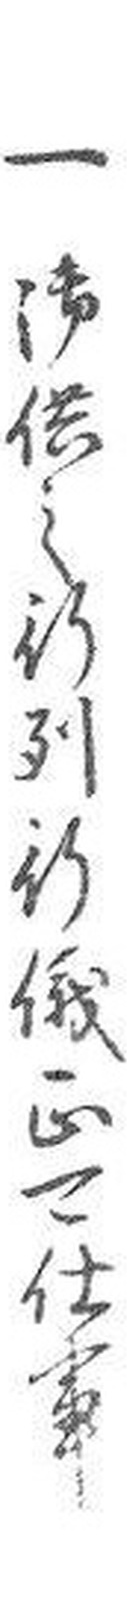一御供之行列行儀正可仕事
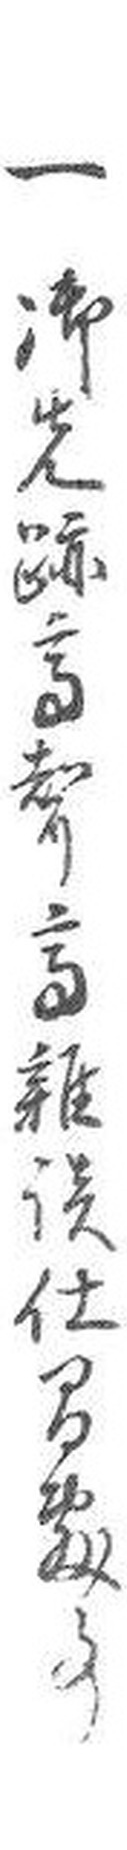一御先跡高声高雑談仕間敷事
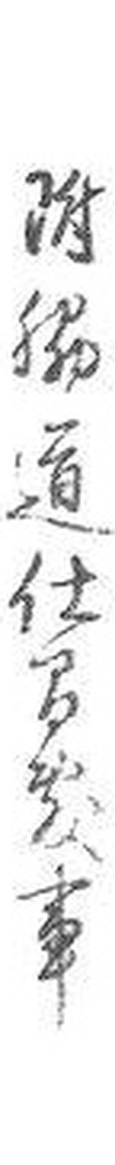附脇道仕間敷事
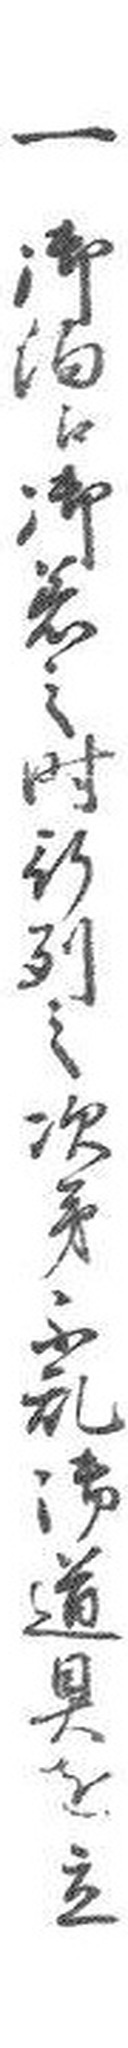一御泊江御着之時行列之次第不乱御道具を立
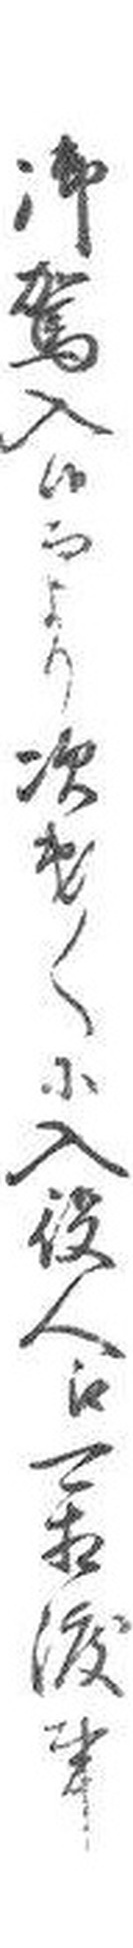御駕入候而より次第〳〵に入役人江可相渡事
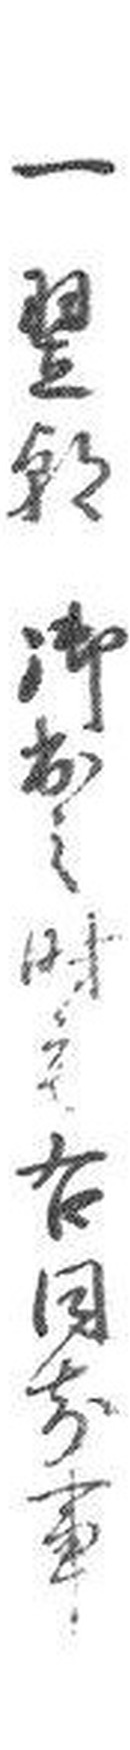一翌朝御出之時も右同前事
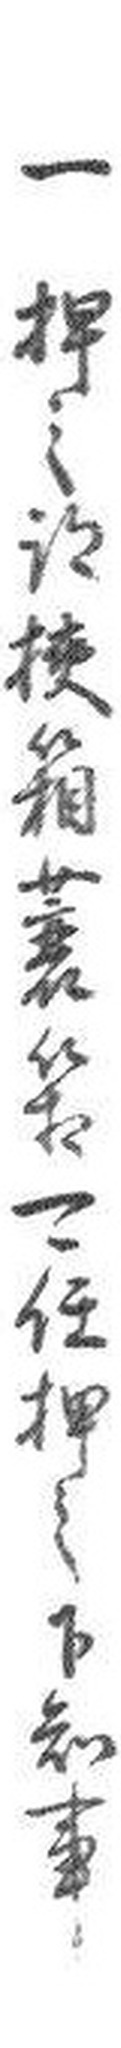一押之跡挟箱蓑箱可任押之下知事
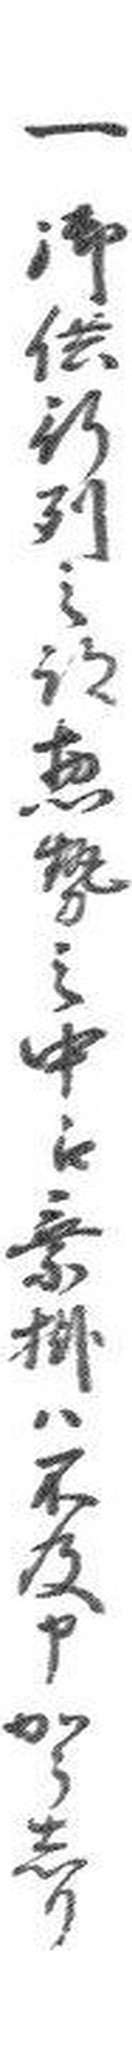一御供行列之跡惣勢之中江乗掛ハ不及申からしり
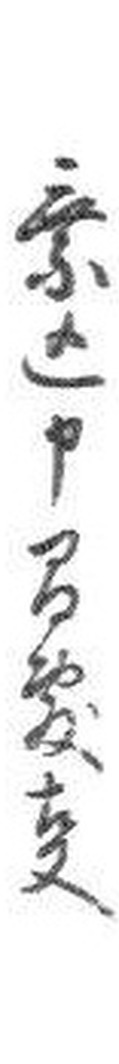乗込申間敷事
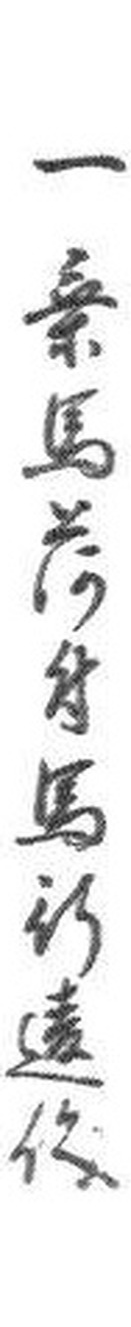一乗馬荷付馬行違儀
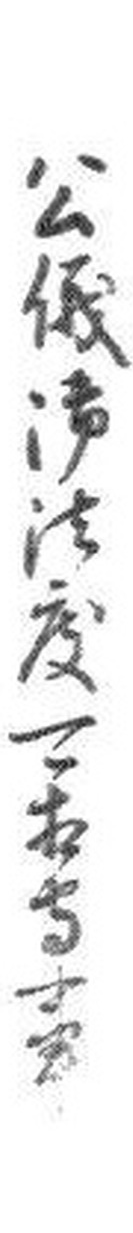公儀御法度可相守事
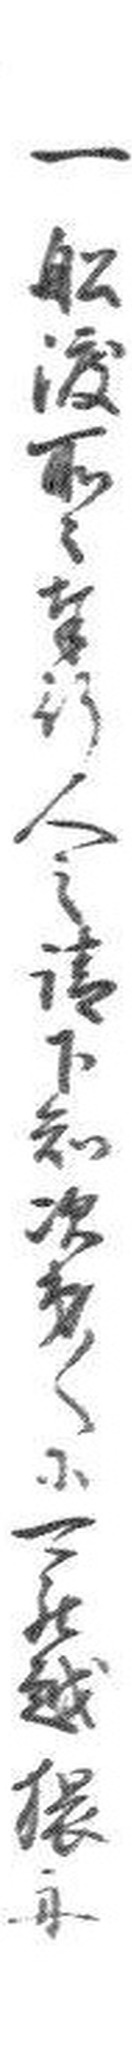一船渡所々奉行人之請下知次第々々に可罷越猥舟
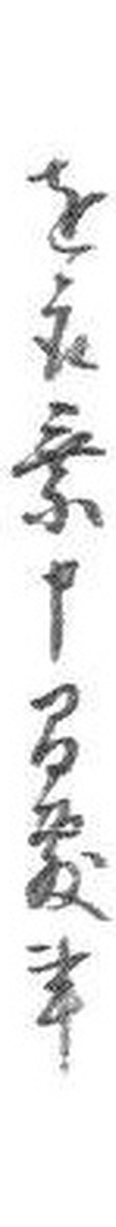を取乗申間敷事
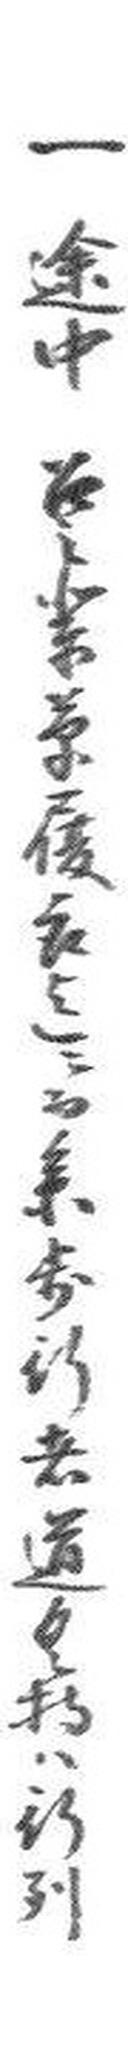一途中召之輩草履取迄ニ而参歩行者道具持ハ行列
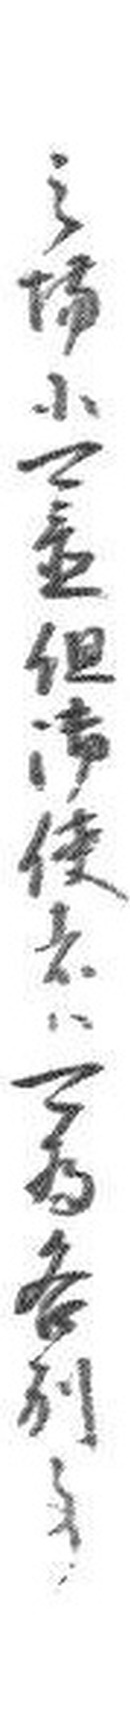之場に可置但御使者ハ可為各別事
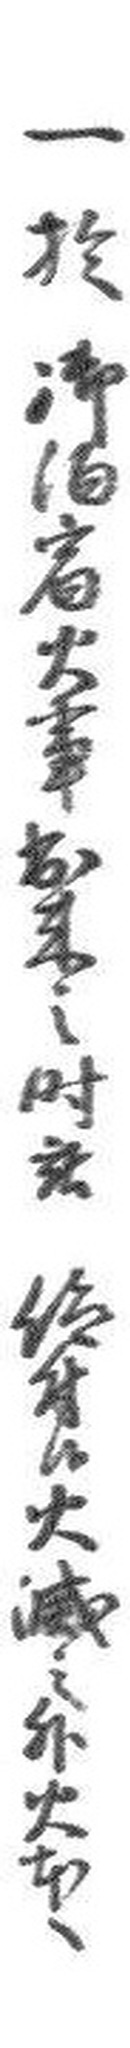一於御泊宿火事出来之時被仰付候火滅之外火本へ
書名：家譜 五 光通公 従寛永十三年到万治二年
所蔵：福井県文書館 Fukui Prefectural Archives
